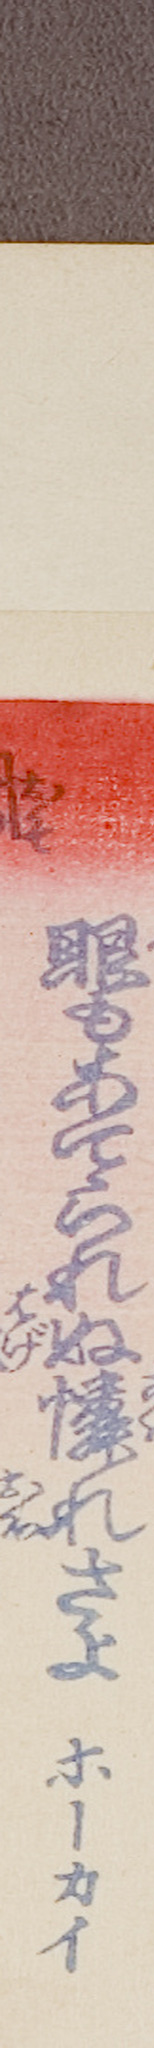眼もあてられぬ憐れさよホーカイ
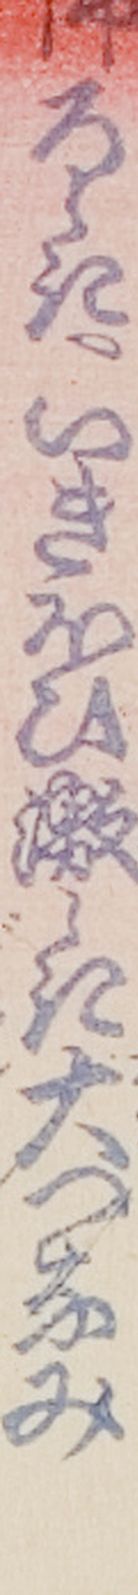〽怖ろしき。いきほひ激しき大つなみ
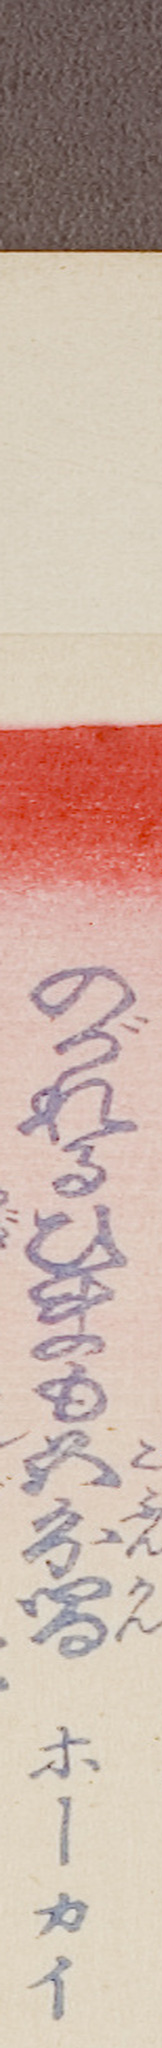のがれるひまも五分間ホーカイ
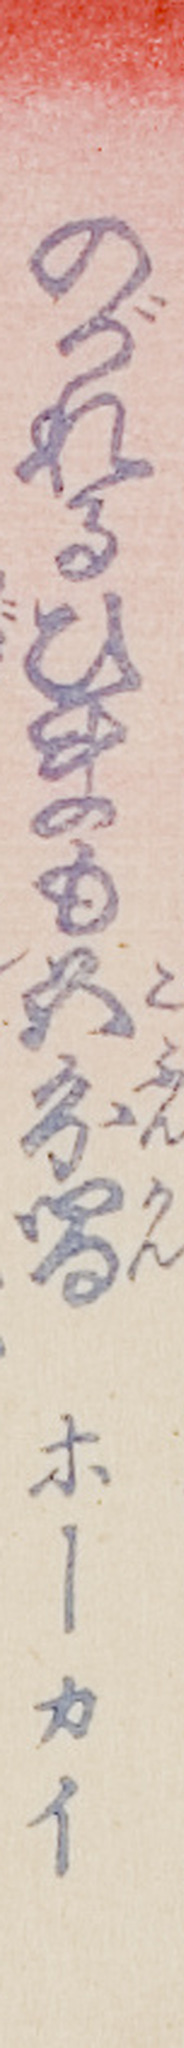のがれるひまも五分間ホーカイ
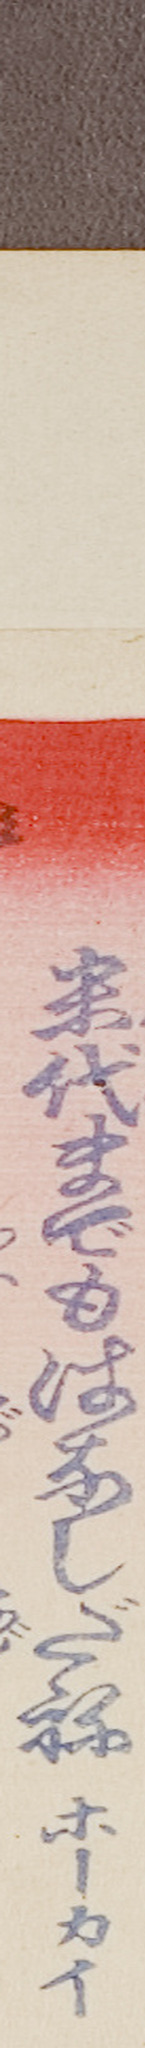末代までもはなしだねホーカイ
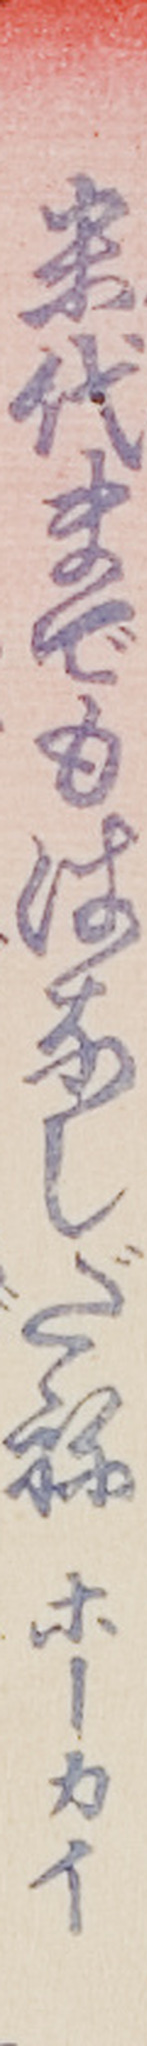末代までもはなしだねホーカイ
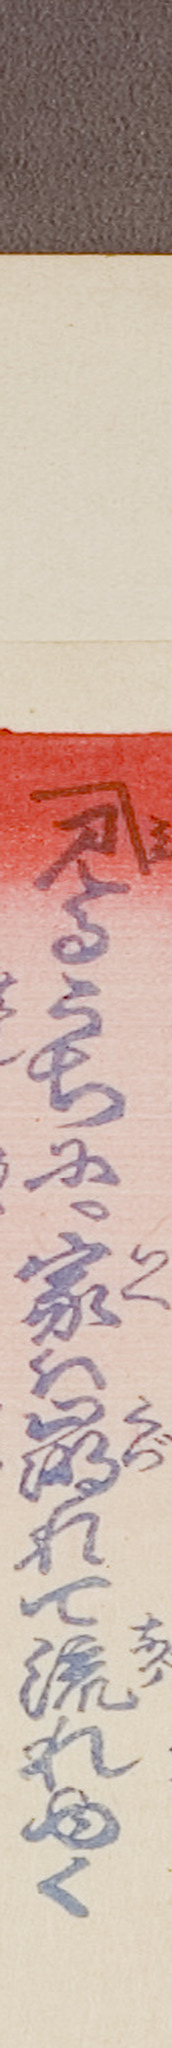〽見るうちに。家は崩れて流れゆく
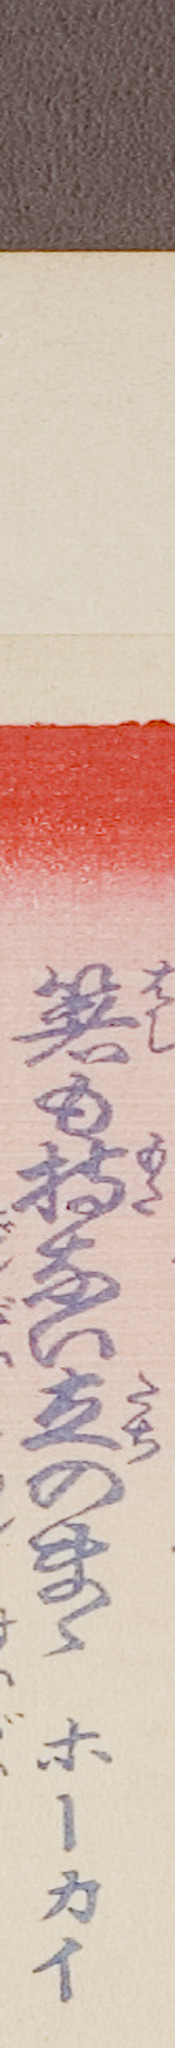箸も持ない立のまゝホーカイ
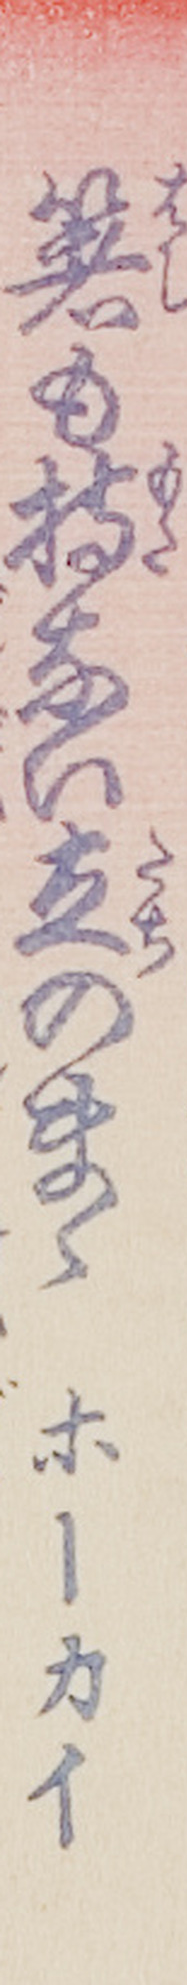箸も持ない立のまゝホーカイ
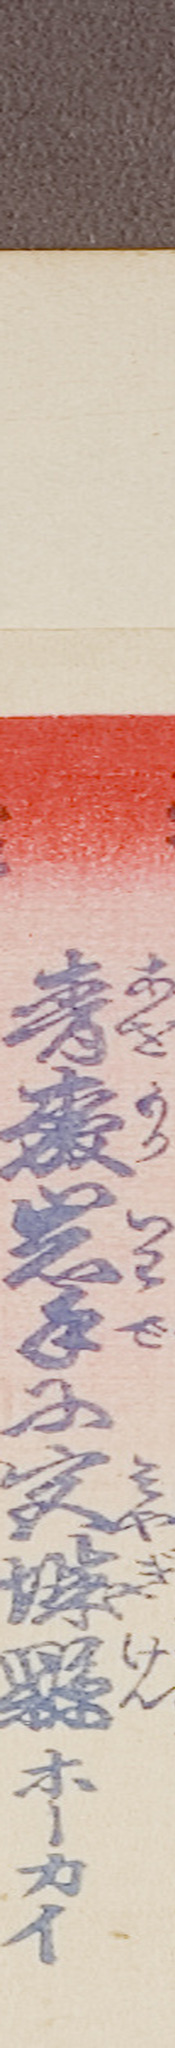青森岩手に宮城県ホーカイ
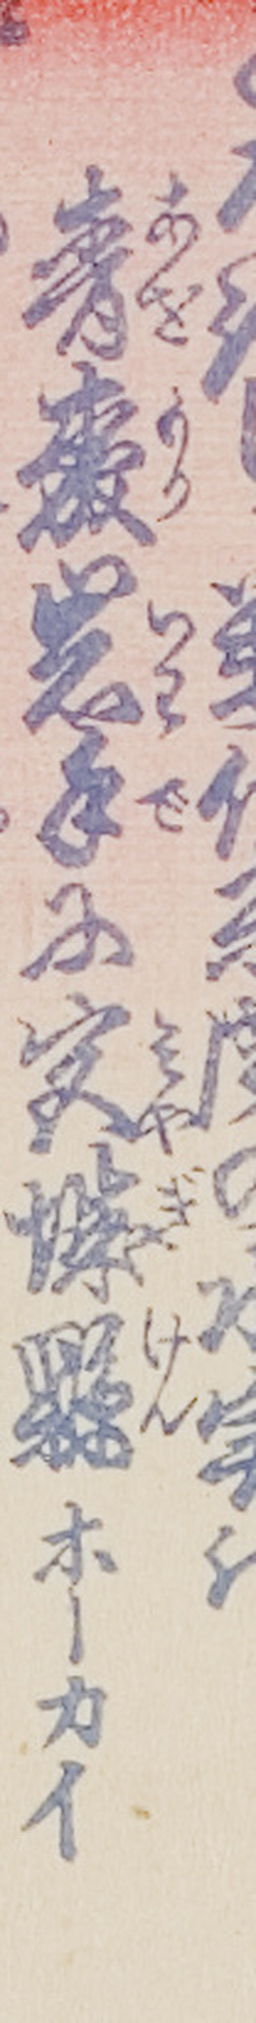青森岩手に宮城県ホーカイ
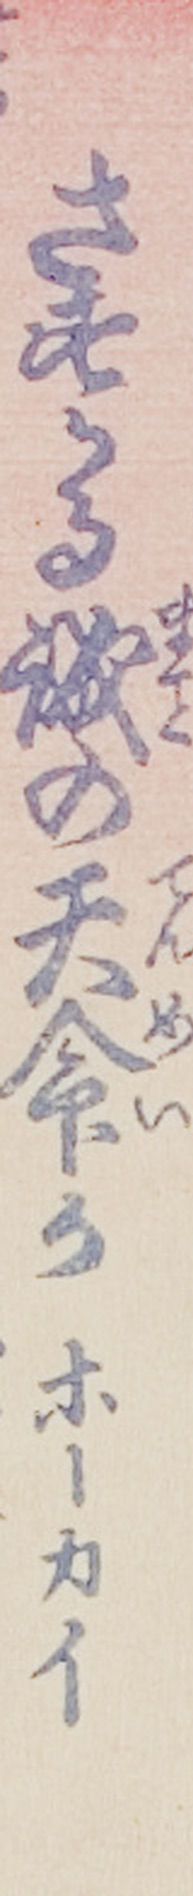さすかる誠の天命かホーカイ
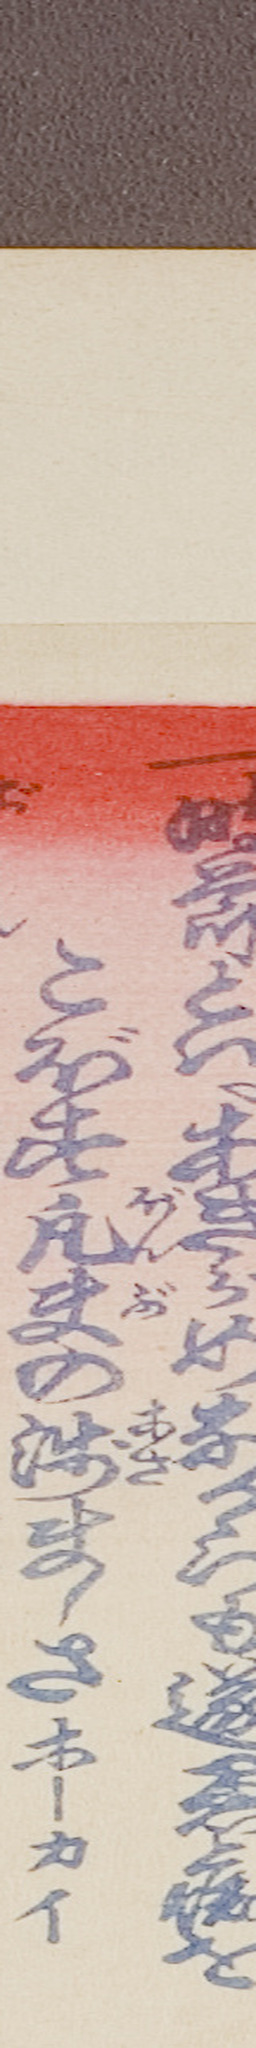こぼす凡夫の浅ましさホーカイ
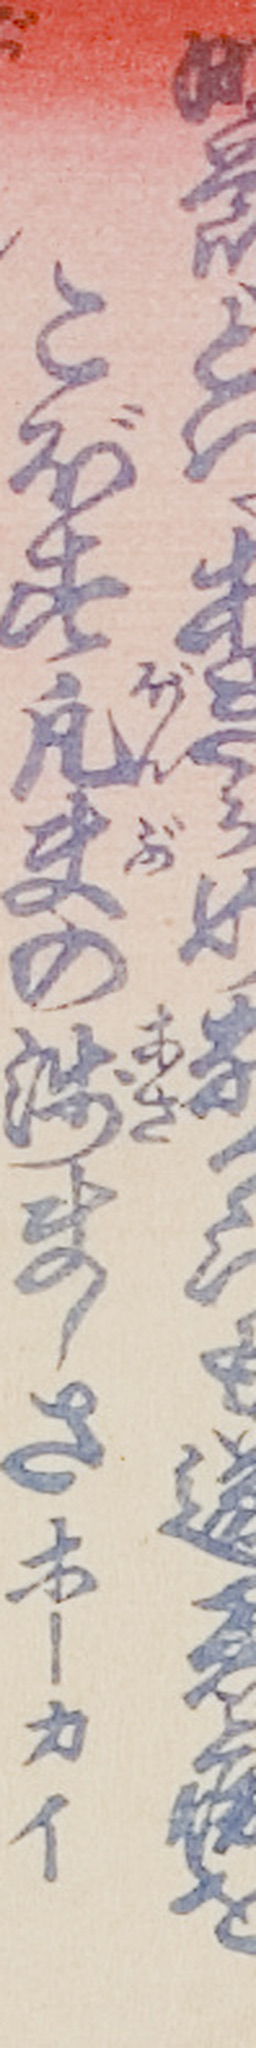こぼす凡夫の浅ましさホーカイ
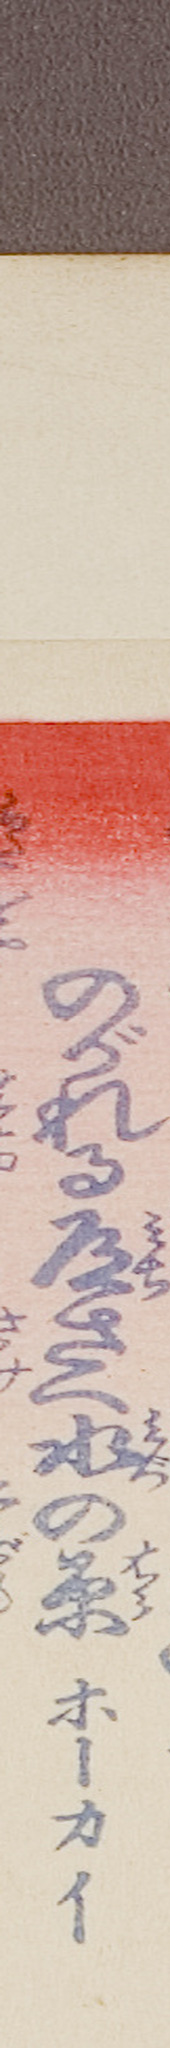のがれる道さへ水の原ホーカイ
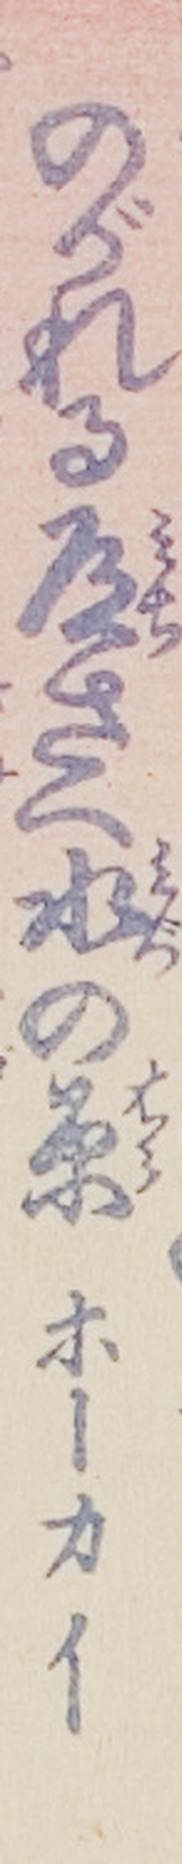のがれる道さへ水の原ホーカイ
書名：北陸三県大つなみホーカイぶし
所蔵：東京大学総合図書館 General Library in the University of Tokyo, JAPAN
